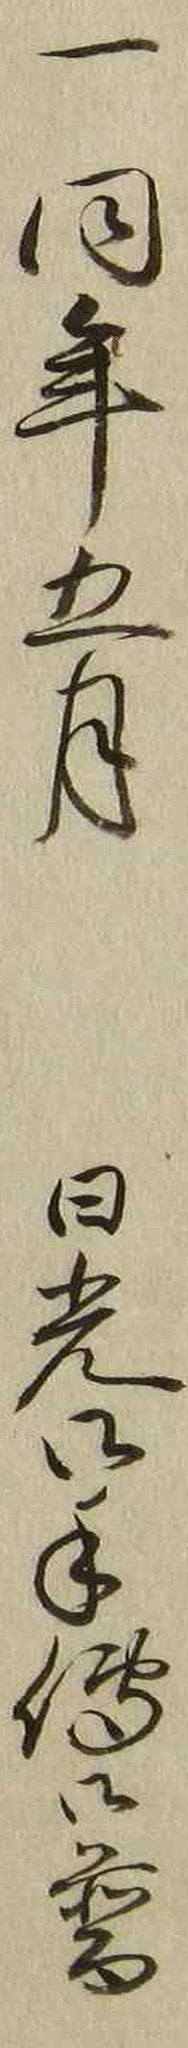一同年五月日光御手伝御普
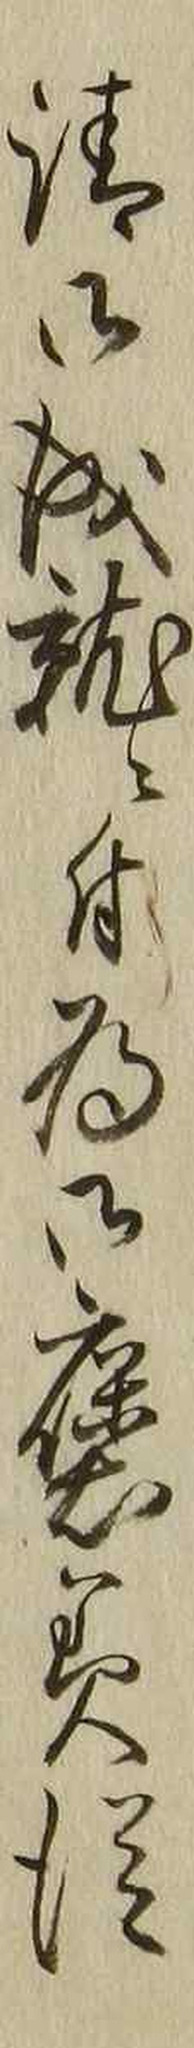請御成就ニ付為御褒美従
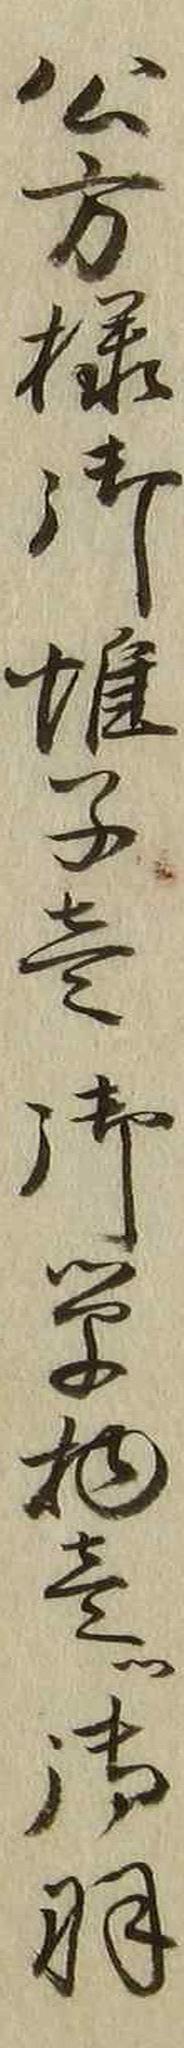公方様御帷子壱御単物壱ツ御羽
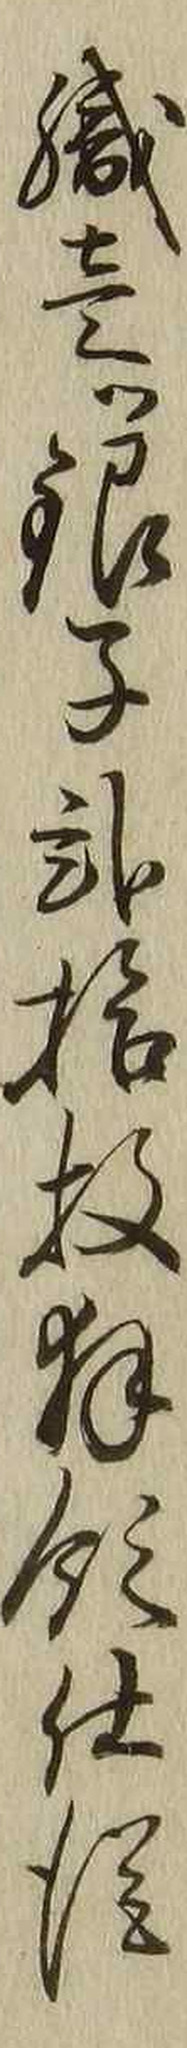織壱ツ銀子弐拾枚拝領仕従
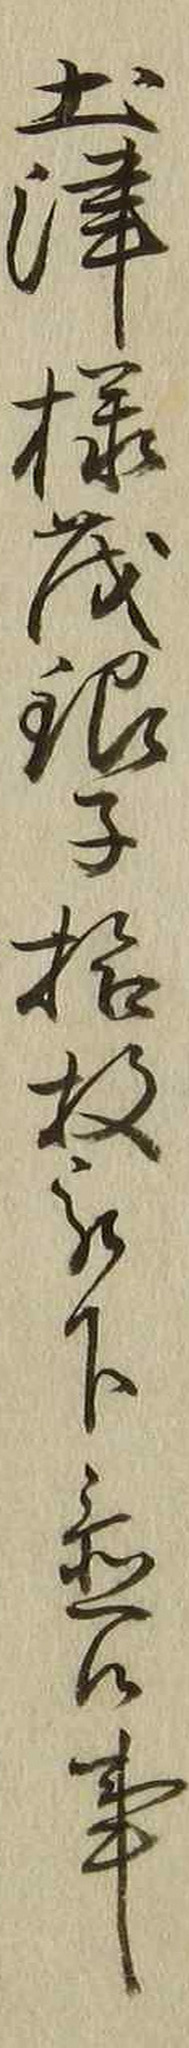土津様も銀子拾枚被下置候事
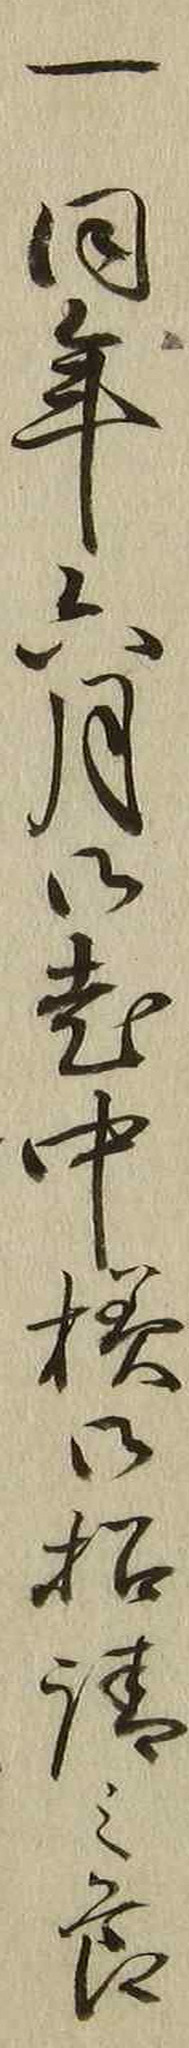一同年六月御老中様御招請之節
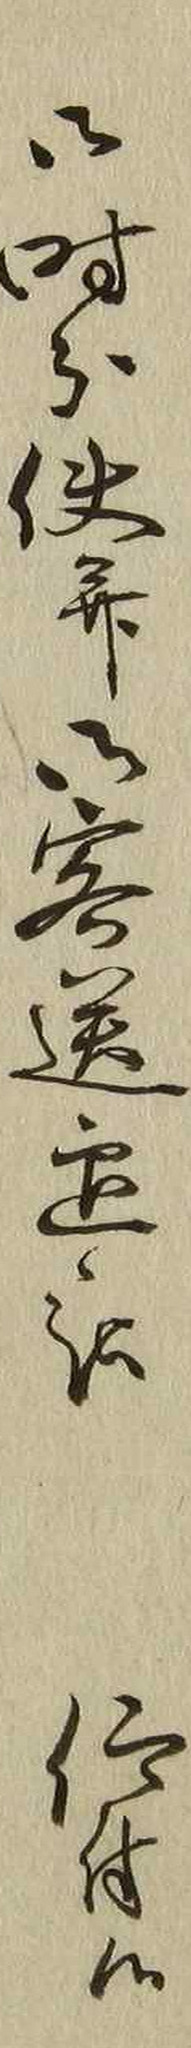御時分使幷御客送迎被仰付候
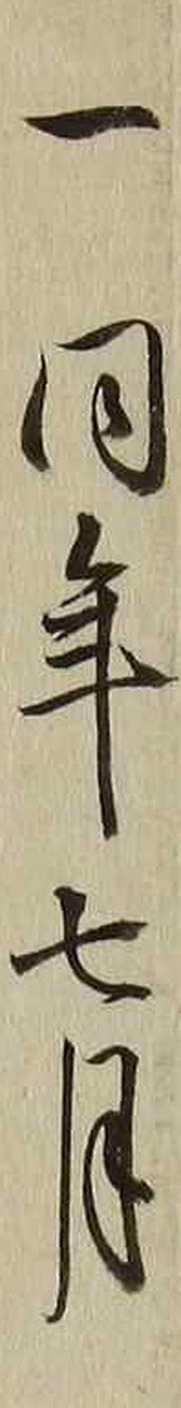一同年七月
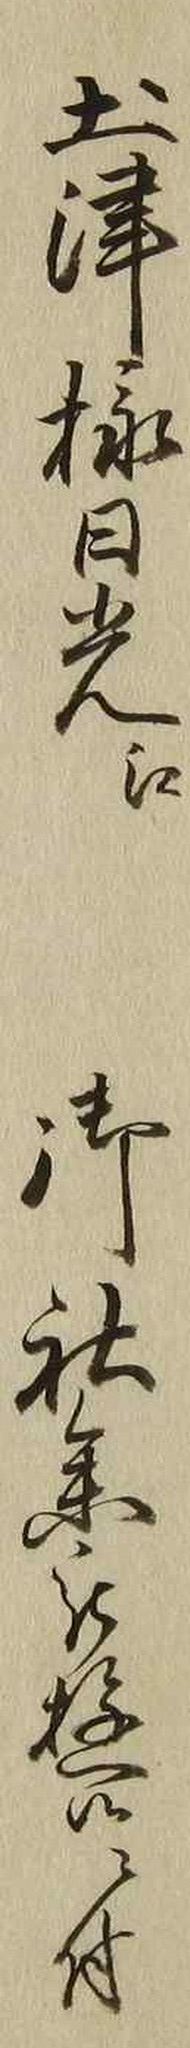土津様日光江御社参被遊候ニ付
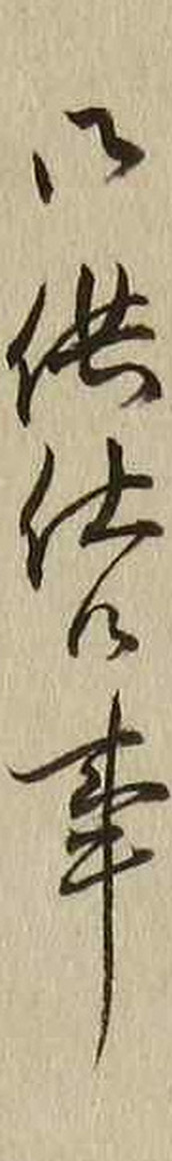御供仕候事
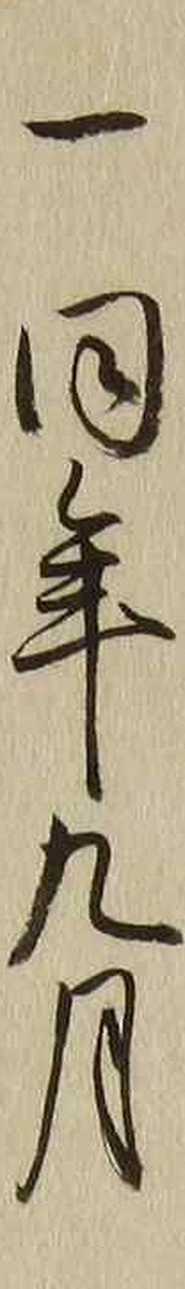一同年九月
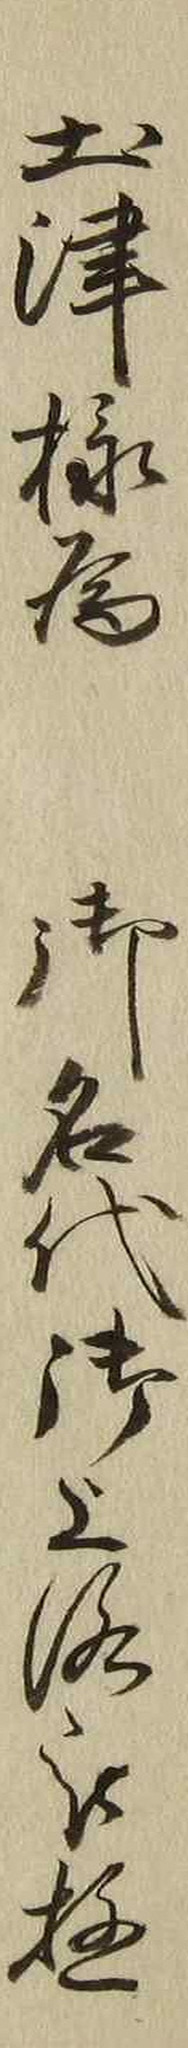土津様為御名代御上洛被遊
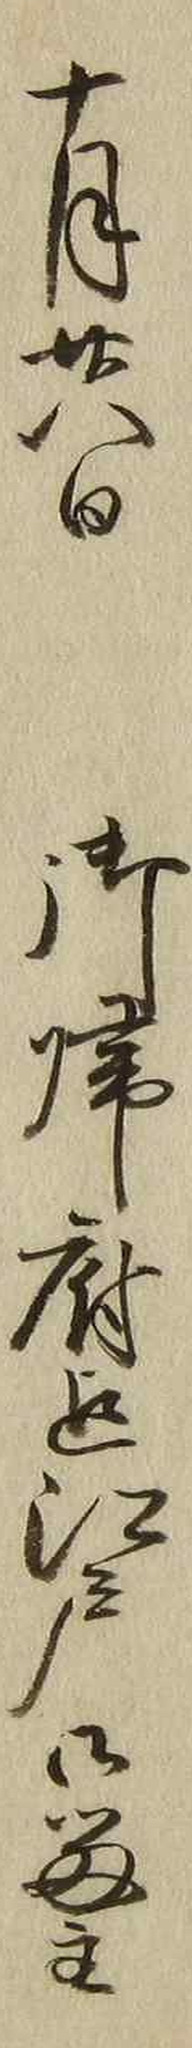十月廿八日御帰府迄江戸御留主
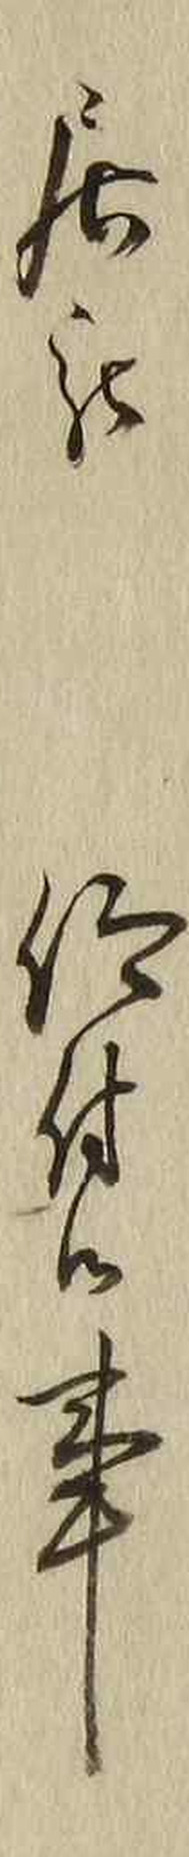居被仰付候事
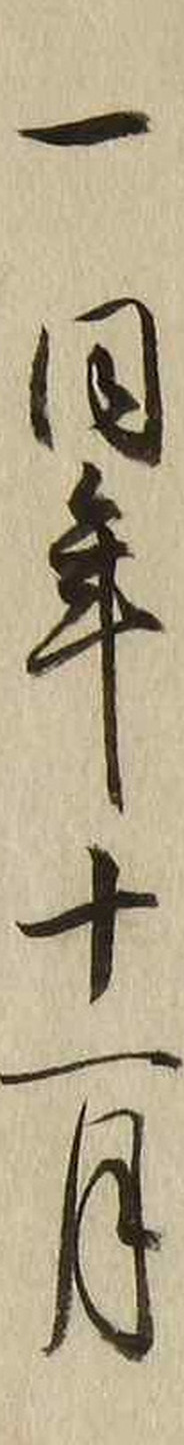一同年十一月
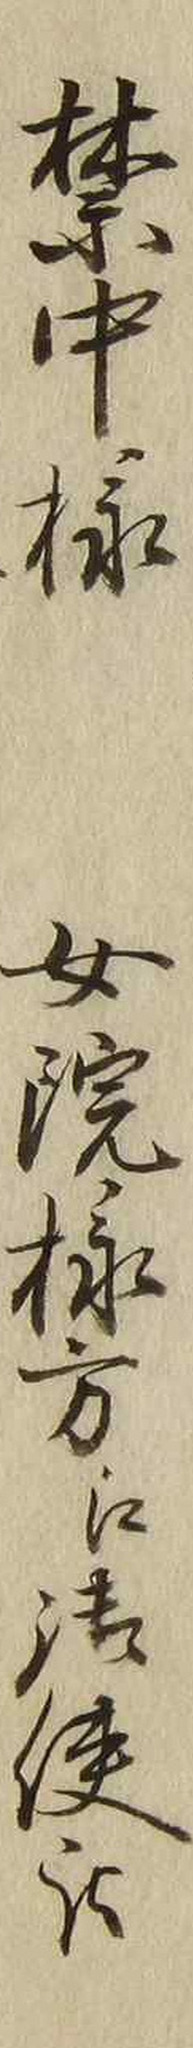禁中様女院様方江御使被
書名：諸士系譜　巻之60　と之部3
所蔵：会津若松市立会津図書館
